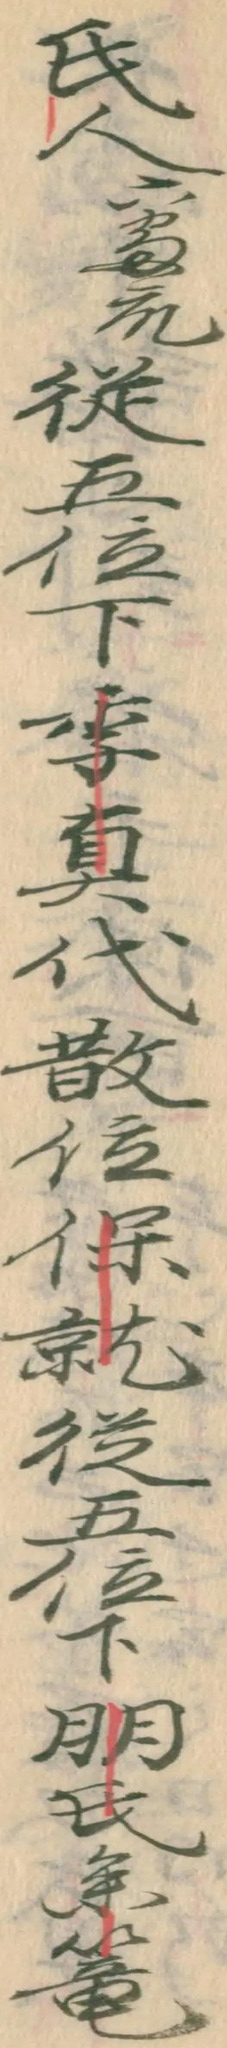氏六番衆従五位下季真代散位保就従五位下朋氏参-篭
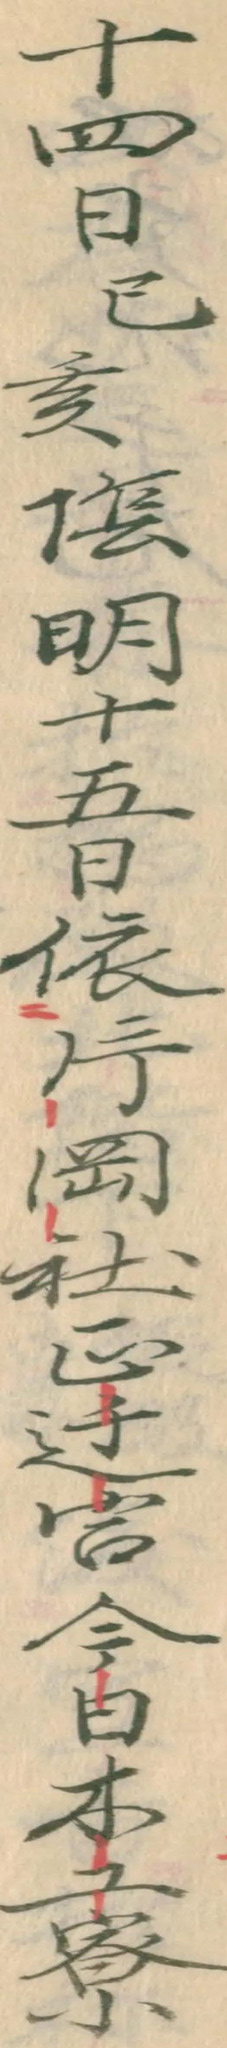十四日己亥陰明十五日依片_岡_社正-迁-宮今-日本-工-寮

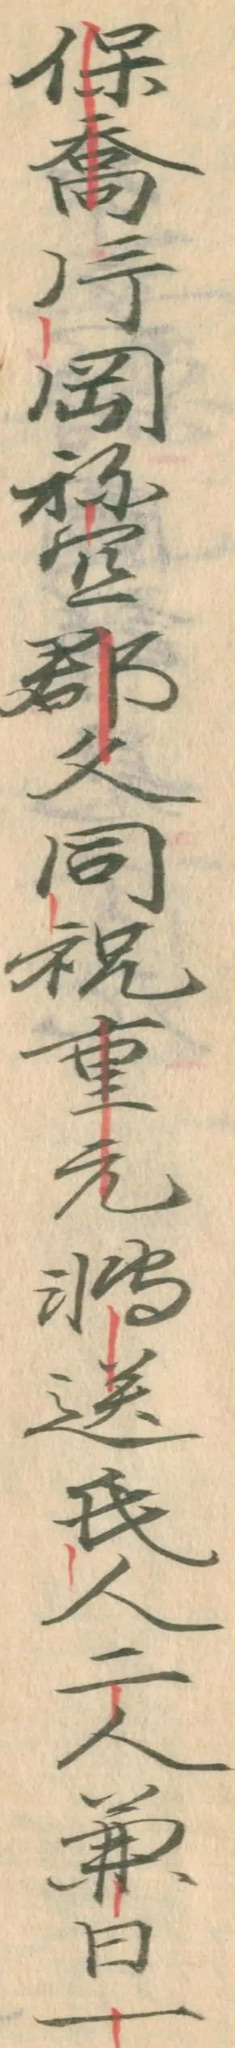保喬片_岡祢-宜郡久同_祝重元転-送氏二-人兼-日一-
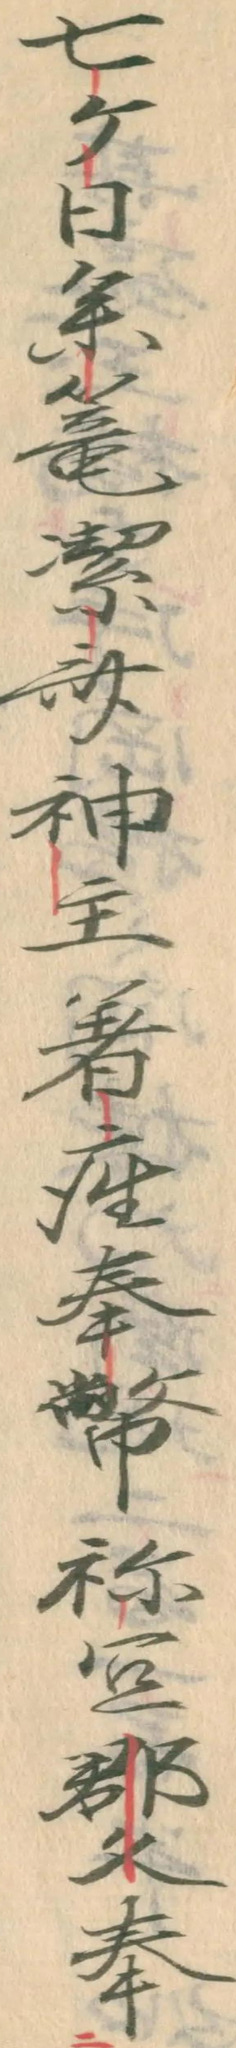七-ケ-日参-篭潔-斎神_主着-座奉-幣祢-宜郡久奉
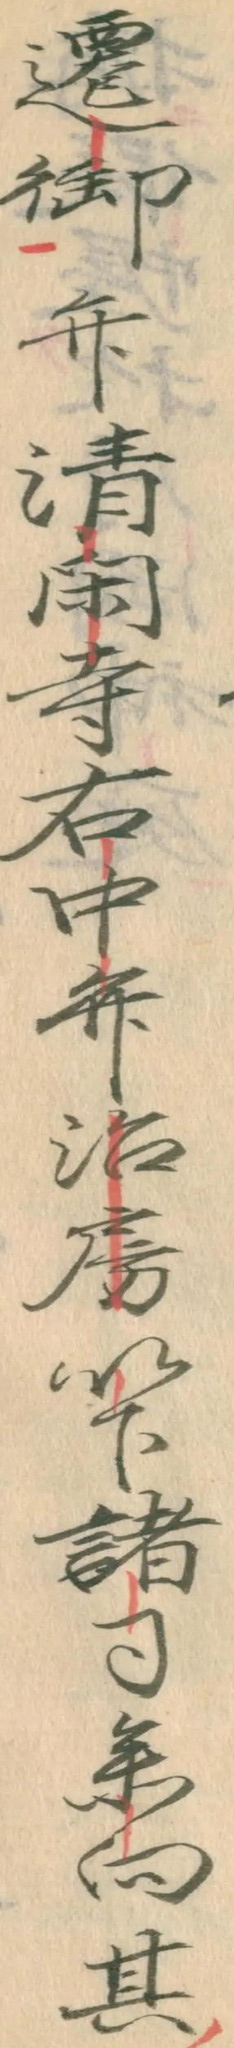遷-御弁清-閑-寺右-中-弁治房以-下諸-司参-向其
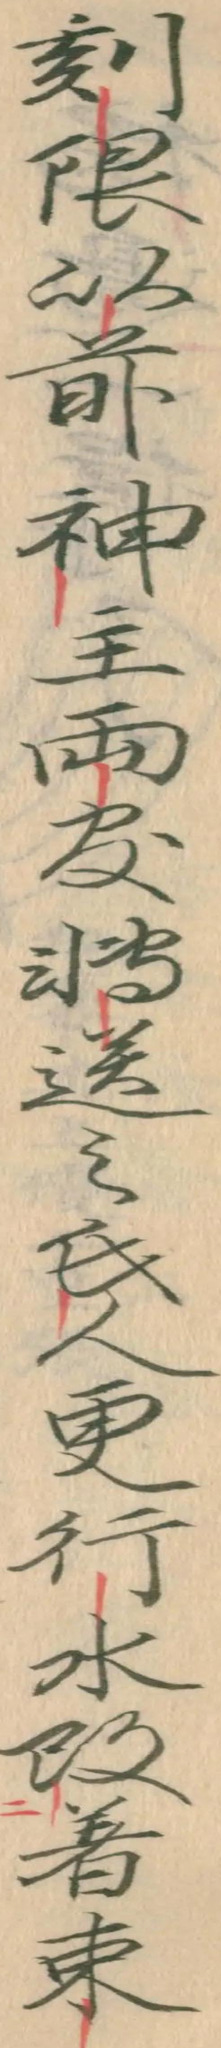刻-限以-前神_主両-官転-送之氏更行-水改着束-

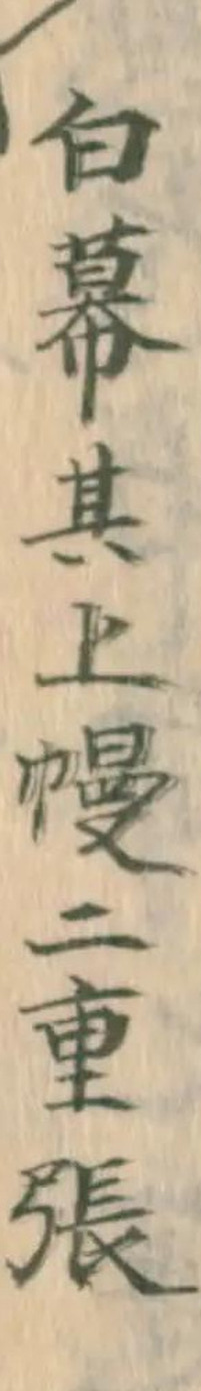白幕其上幔二重張
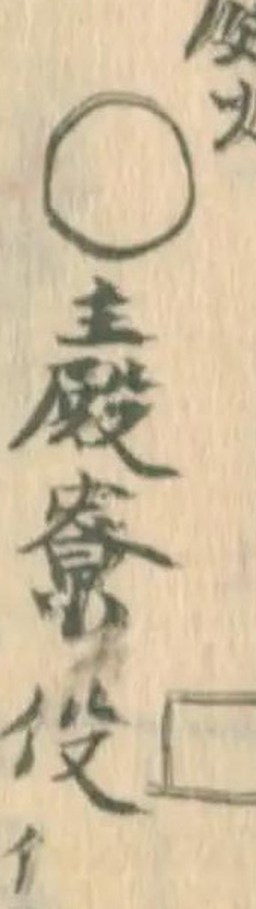主殿寮役白

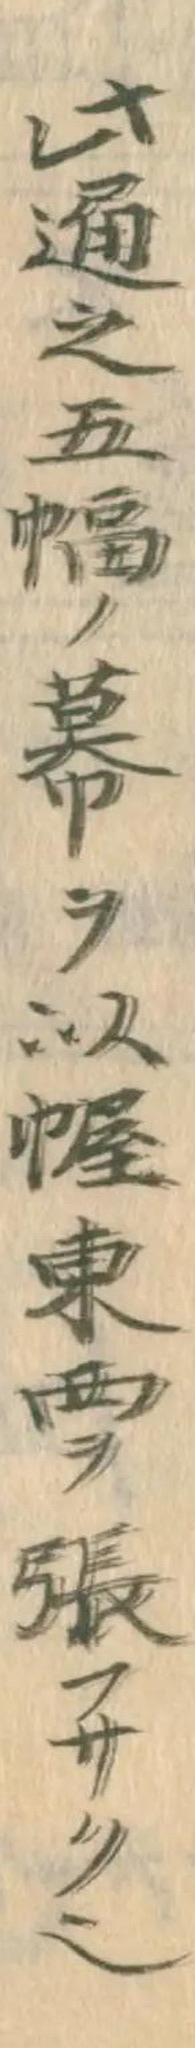此通之五幅ノ幕ヲ以幄東西ヲ張フサク也
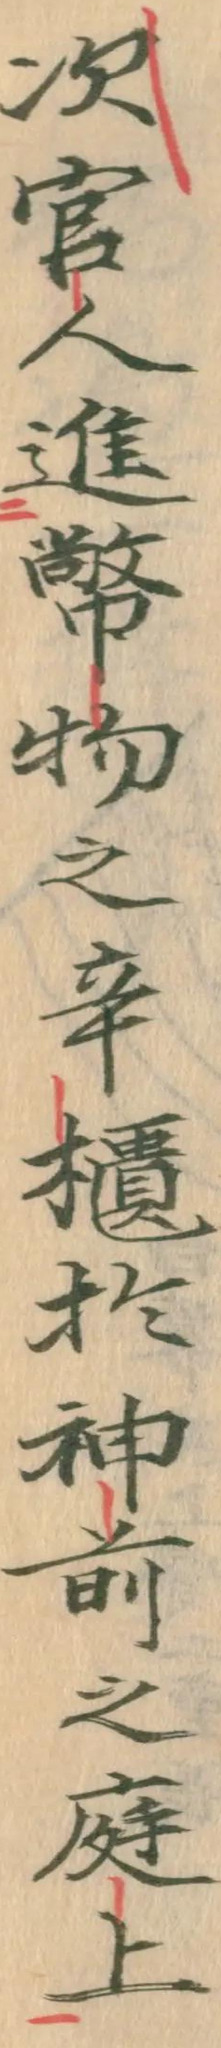次官-人進幣-物之辛_櫃於神-前之庭-上
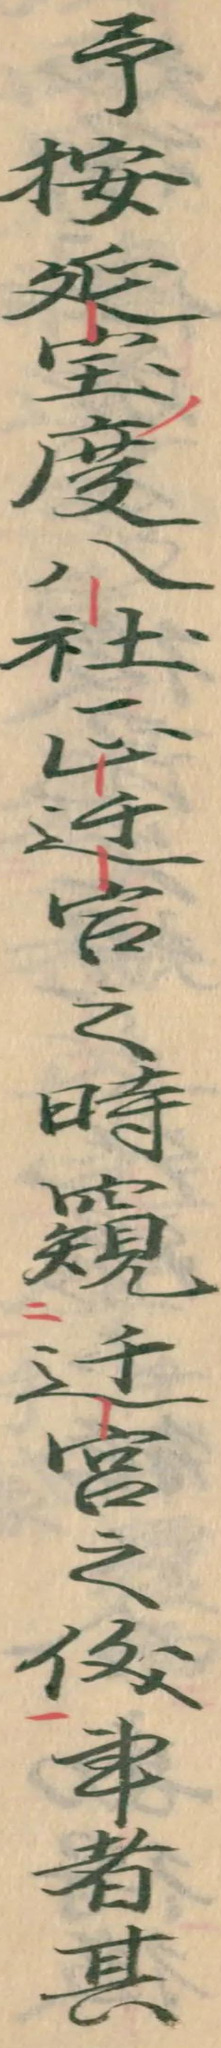予按延-宝度八-社正-迁-宮之時窺迁-宮之儀事者其

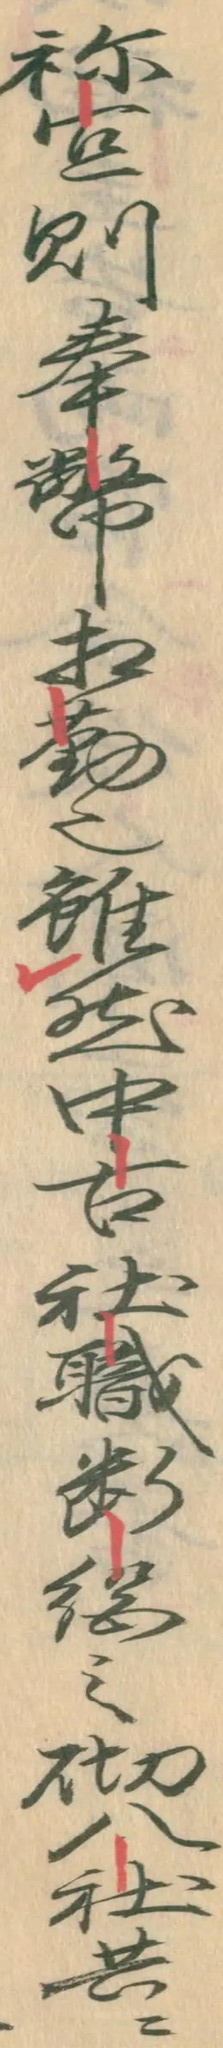祢-宜則奉-幣相_勤也雖然中-古社-職断-絶之砌八-社共ニ
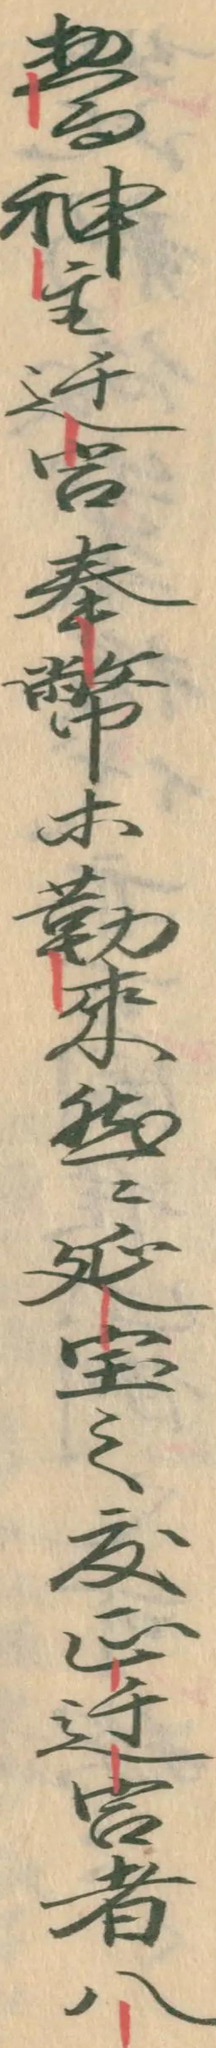惣_而神_主迁-宮奉-幣等勤_来然ニ延-宝之度正-迁-宮者八-
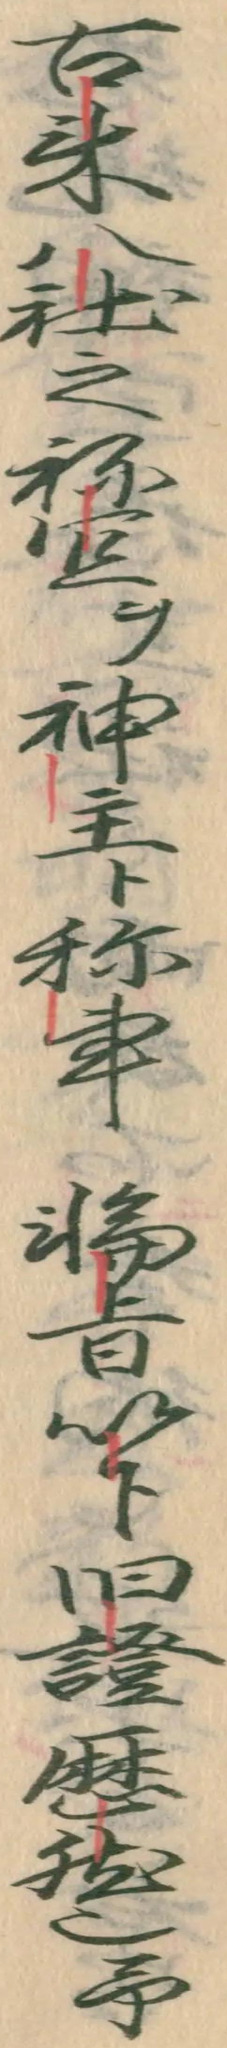古-来八-社之祢-宜ヲ神_主ト称_事輪-旨以-下旧-証歴-然也予

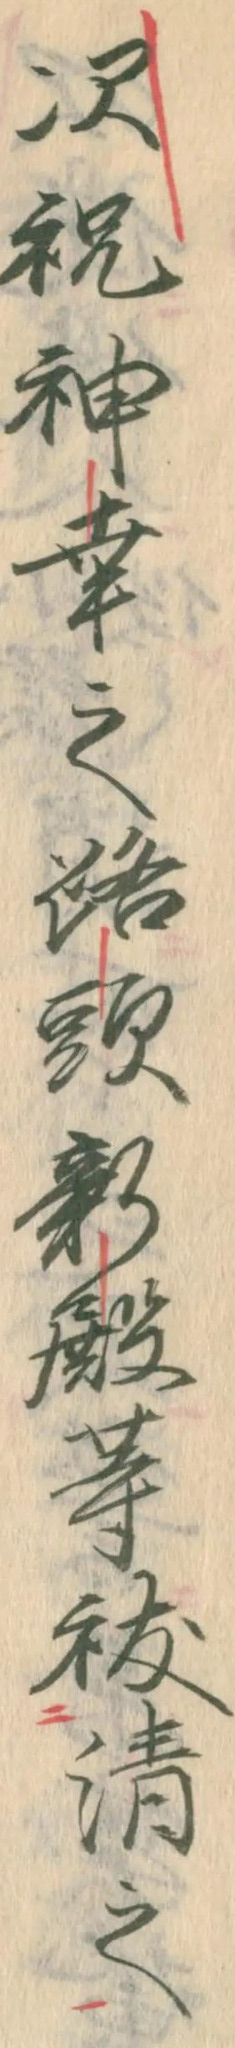次祝神-幸之路-頭新-殿等祓清之
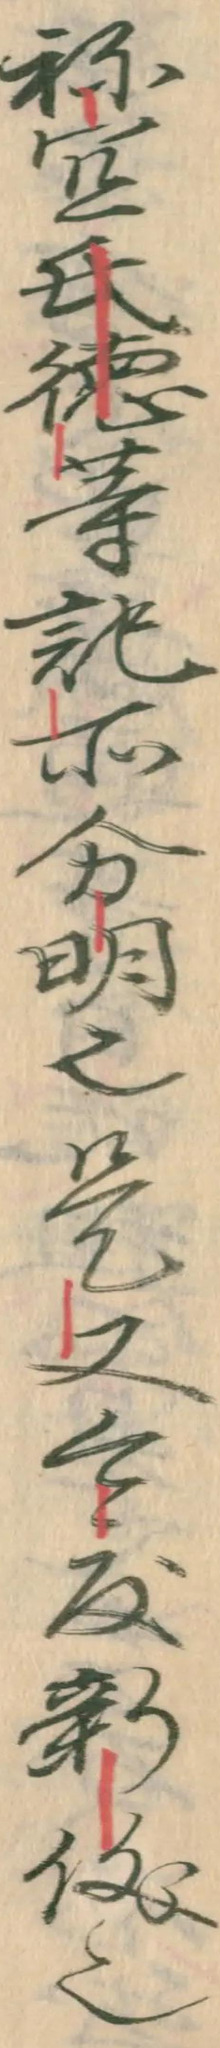祢-宜氏徳等記_所分-明也是_又今-度新-儀也
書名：賀茂社記録. 第16冊
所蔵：国立国会図書館 National Diet Library, JAPAN
